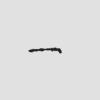一
